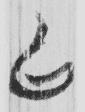㠯（以）
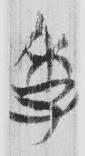季
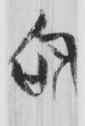和
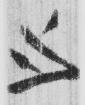之
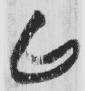㠯（以）
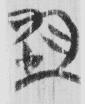均
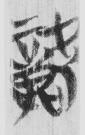{章欠口}
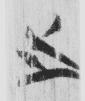之
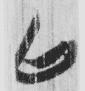㠯（以）
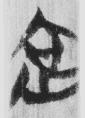哀
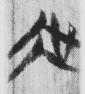吳
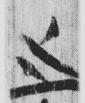之
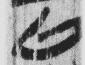㠯（以）
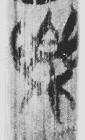樂
